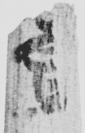壴（喜-矣）
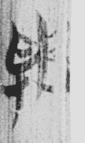與
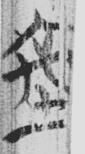○（禹）
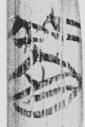○（孰）
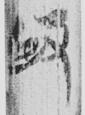臤（賢）
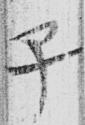子
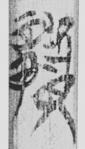贛（貢）
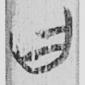曰
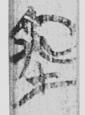○（禹）
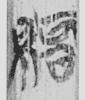○（治）
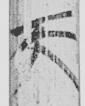天
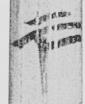下
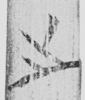之
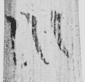川
